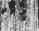九
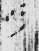月
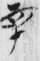辛
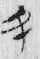丑
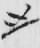之
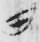日
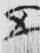五
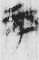帀（師）
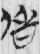俈
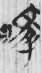○（爰）
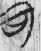司
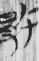敗
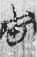周
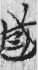國
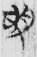受
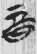○（期）
